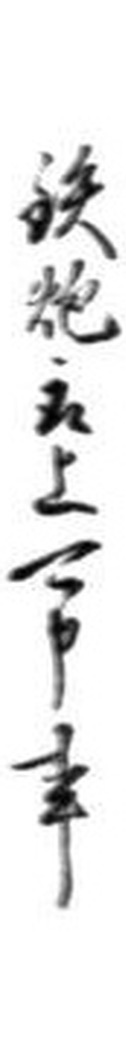鉄炮取上可申事
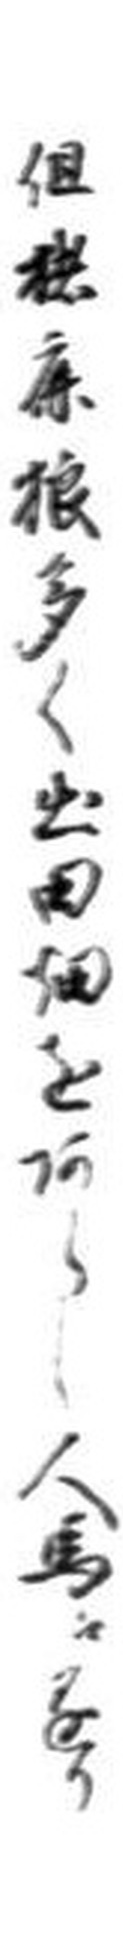但猪鹿狼多く出田畑をあらし人馬江懸り
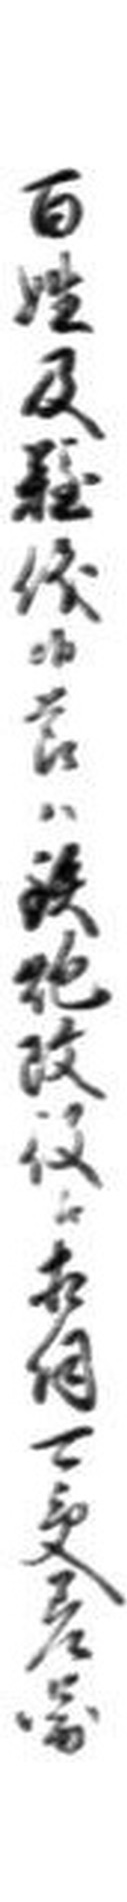百姓及難儀候節ハ鉄炮改役江相伺可受差図
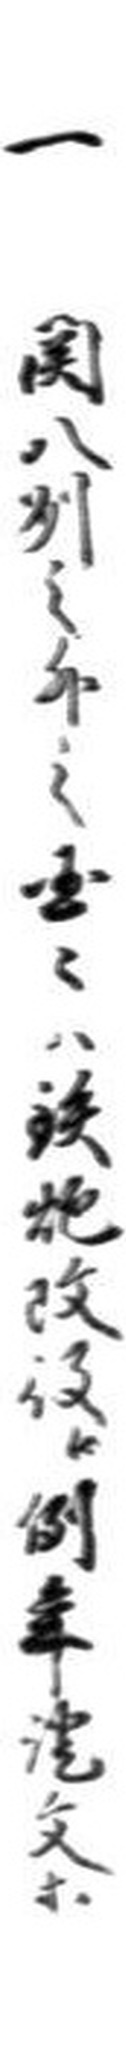一関八州之外之国々ハ鉄炮改役江例年証文等
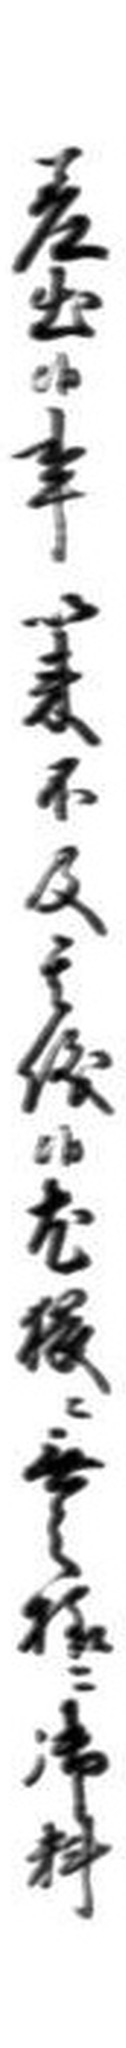差出候事以来不及其儀候尤猥ニ無之様ニ御料
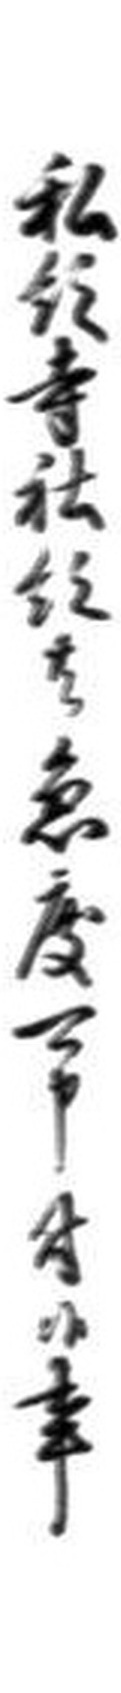私領寺社領共急度可申付候事

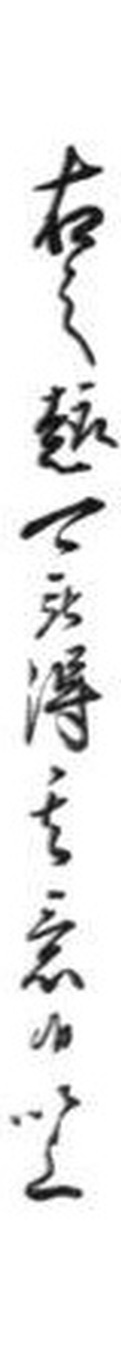右之趣可被得其意候以上
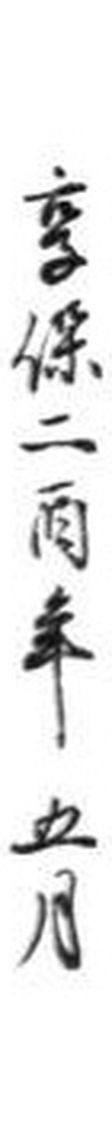享保二酉年五月
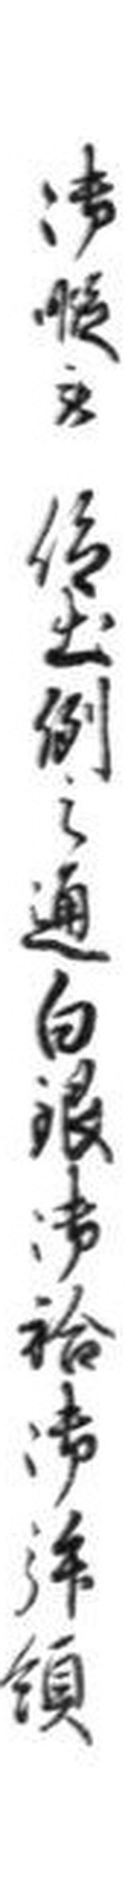御暇被仰出例之通白銀御袷御拝領
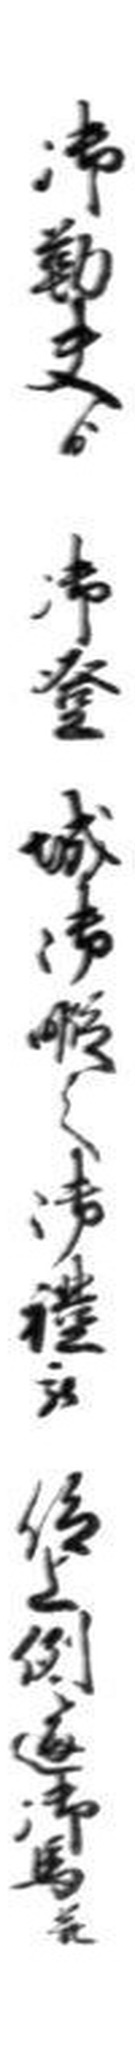御勤夫ゟ御登城御暇之御礼被仰上例之通御馬并
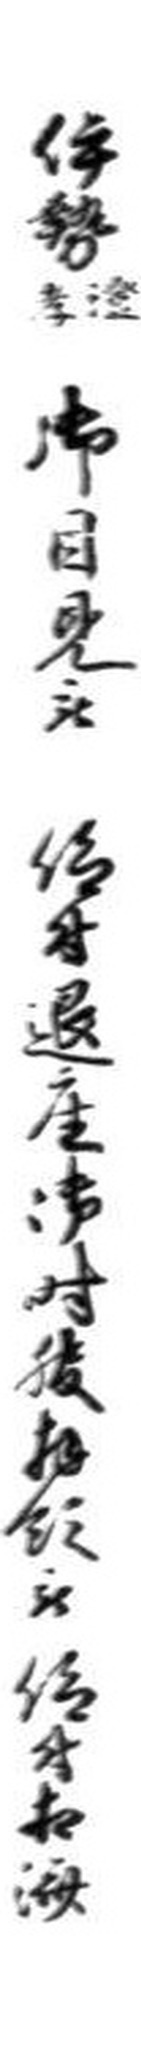孝御目見被仰付退座御時服拝領被仰付相済
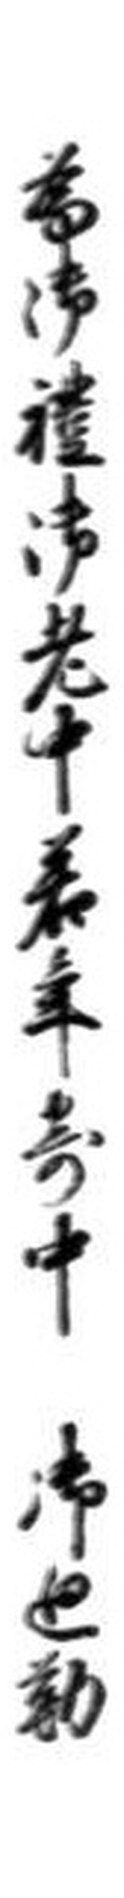為御礼御老中若年寄中御廻勤
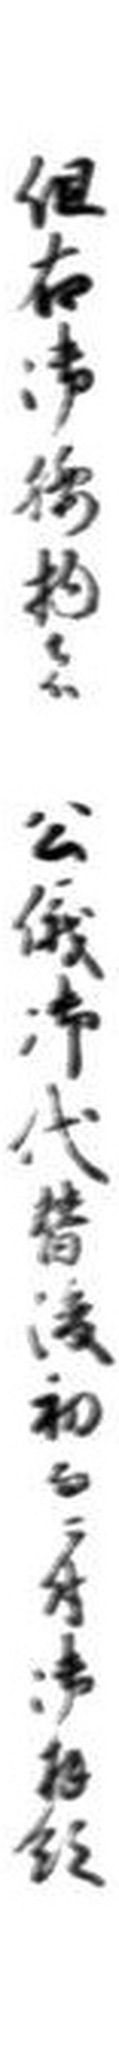但右御腰物者公儀御代替後初而ニ付御拝領
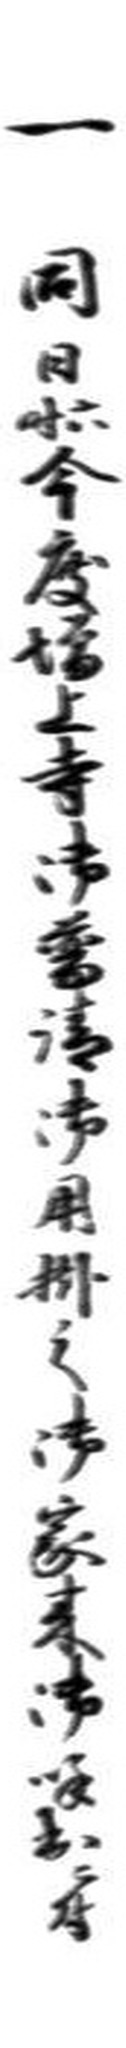時今度増上寺御普請御用掛之御家来御呼出ニ付
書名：家譜 三十二 吉邦公 従享保二年到享保三年
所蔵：福井県文書館 Fukui Prefectural Archives
